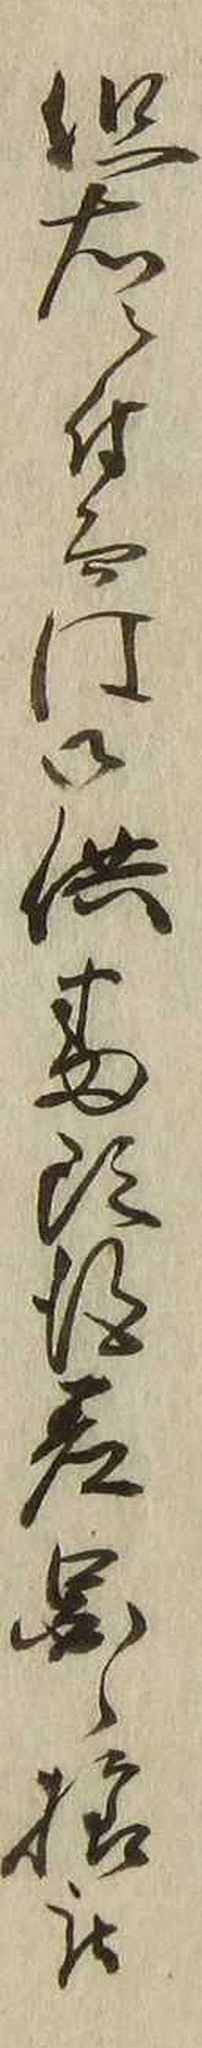但右ニ付而は御供番頭後差図候様被
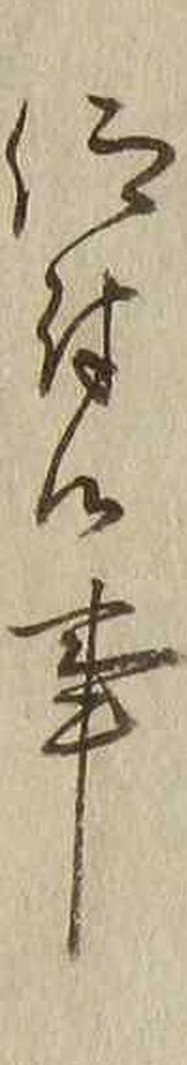仰付候事
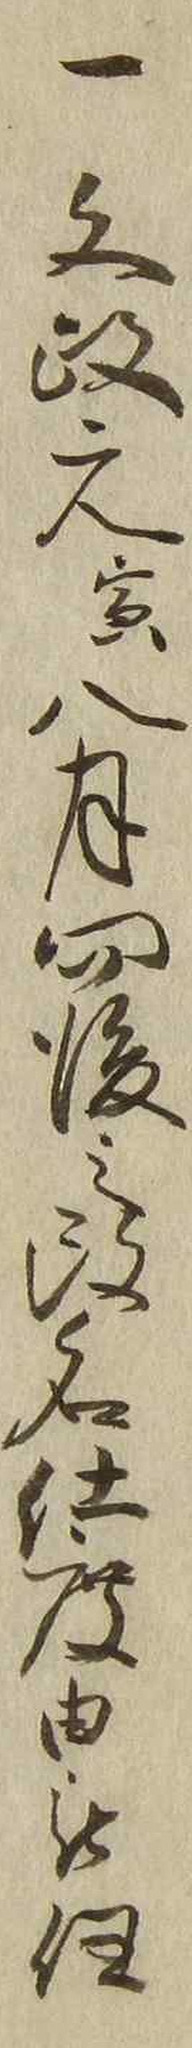一文政元寅八月問後之改名仕度由被任
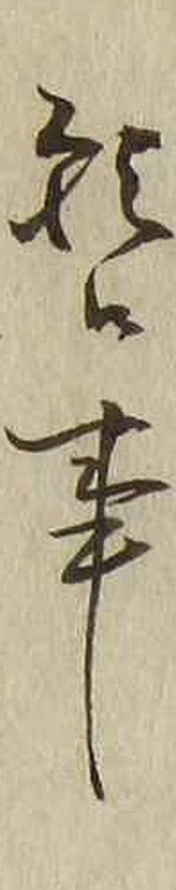願候事

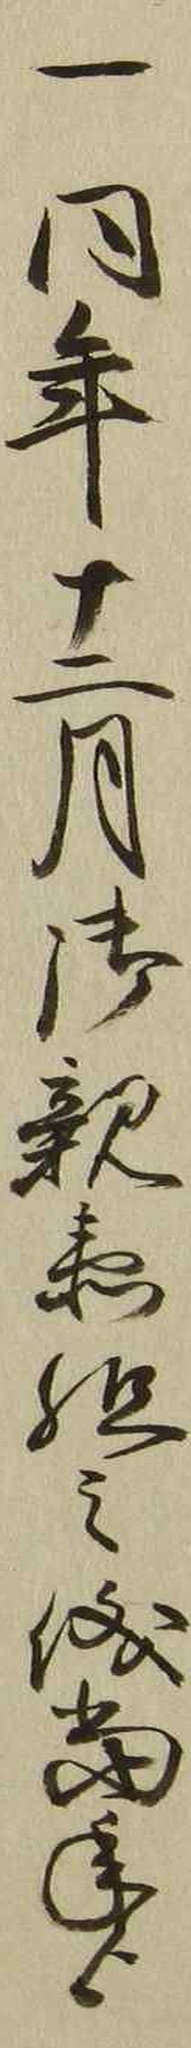一同年十二月御親衛組之儀当年ゟ
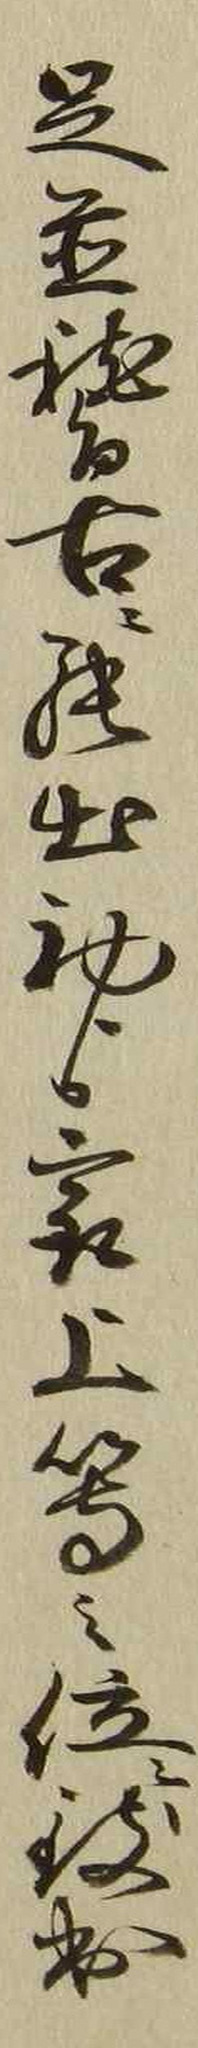足並稽古ニ罷出初ゟ最上等之位ニ致出
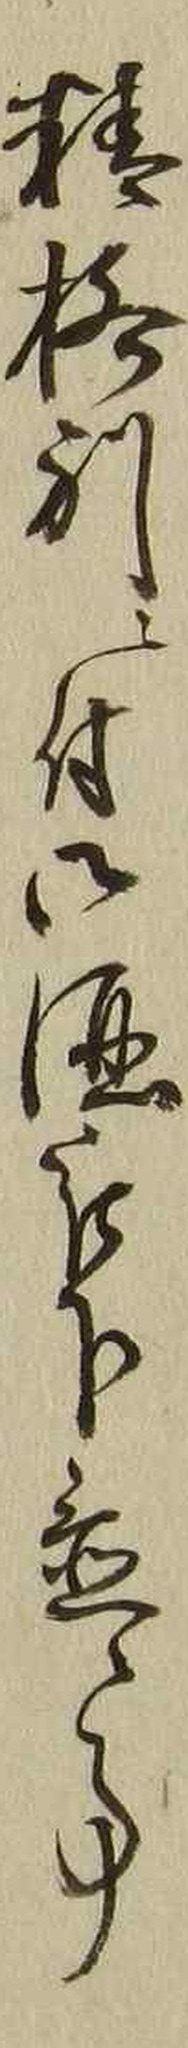精格別ニ付御酒被下置候事
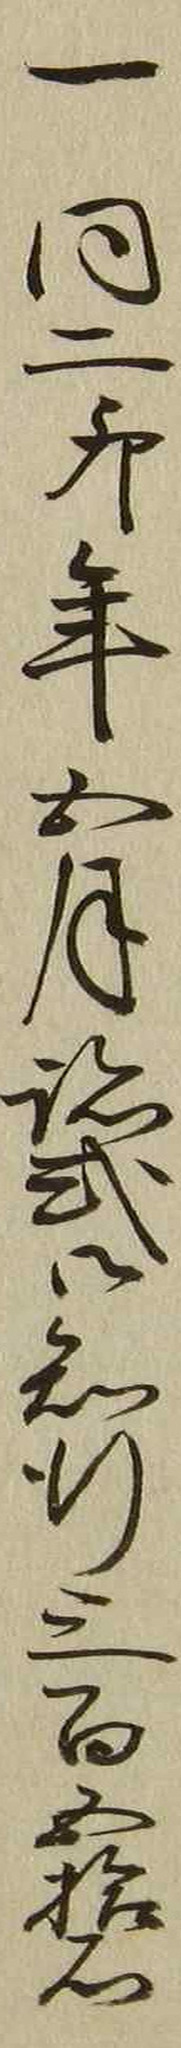一同二卯年五月跡式御知行三百五拾石
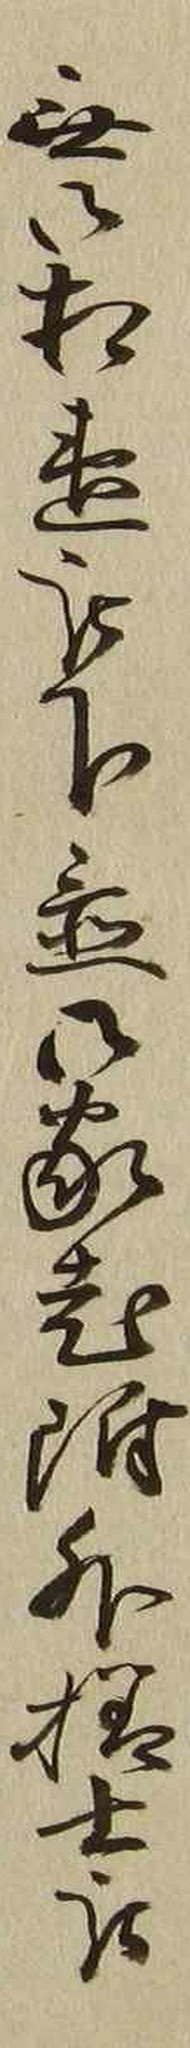無御相違被下置御家老附外様士被
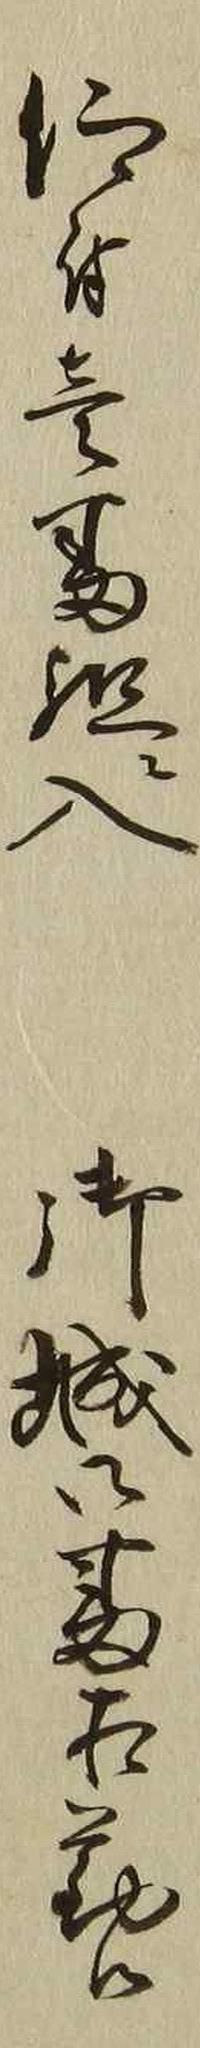仰付壱番組ニ入御城御番相勤候
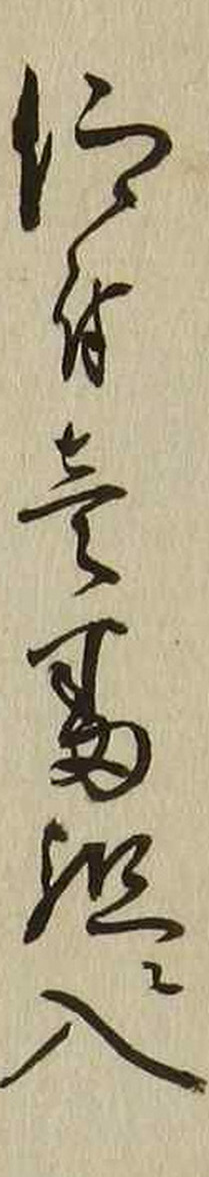仰付壱番組へ入候
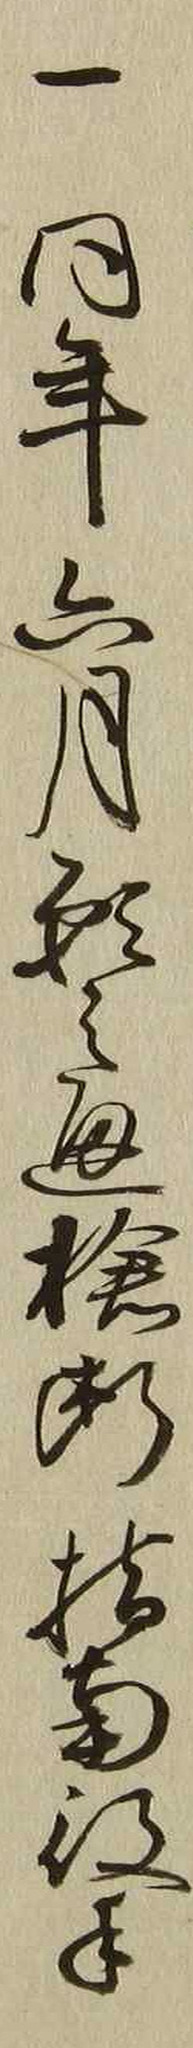一同年六月願之通槍術指南役手
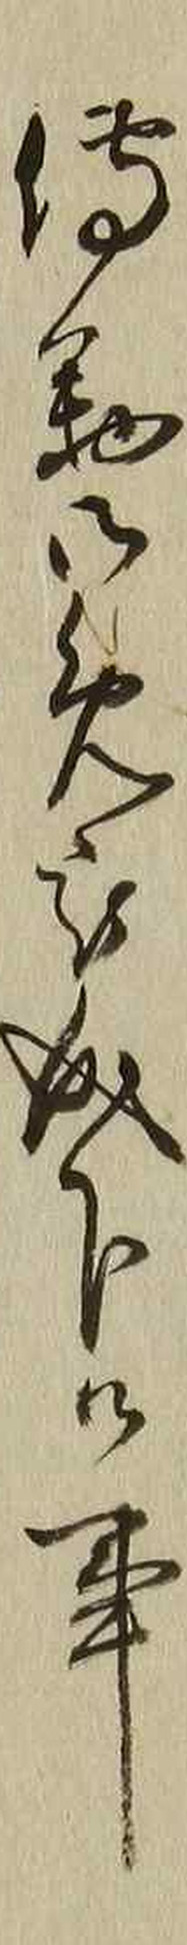伝勤御免被成下候事
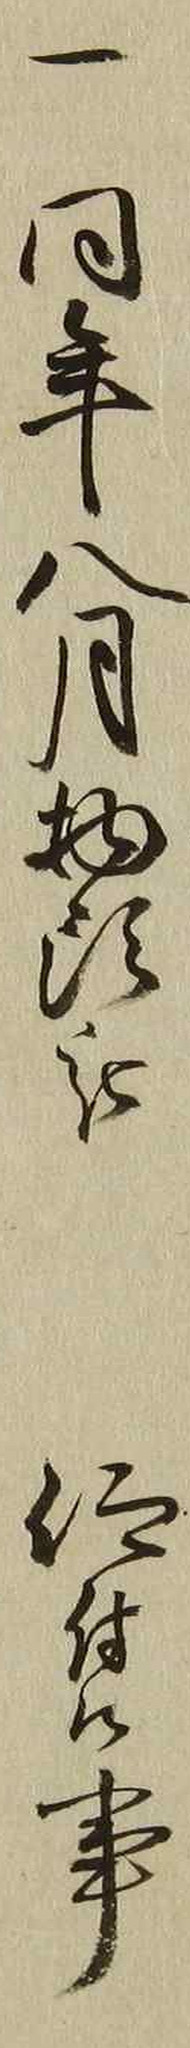一同年八月物頭被仰付候事
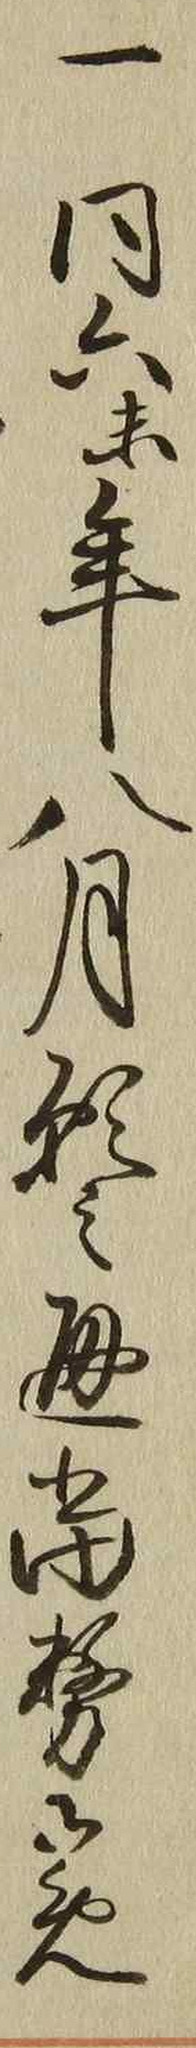一同六未年八月願之通当務御免
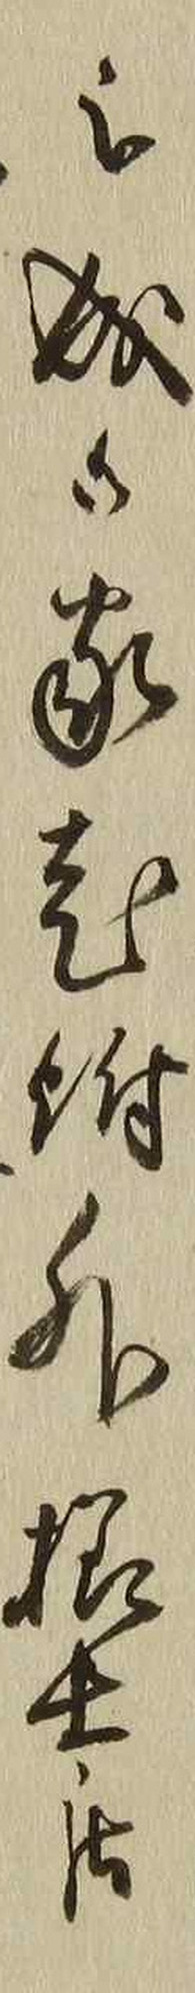被成御家老附外様士被
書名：諸士系譜　巻之60　と之部3
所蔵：会津若松市立会津図書館
